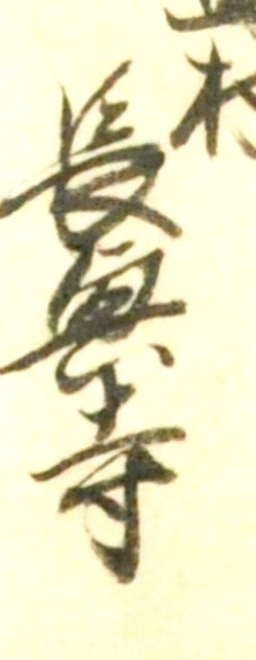長興寺

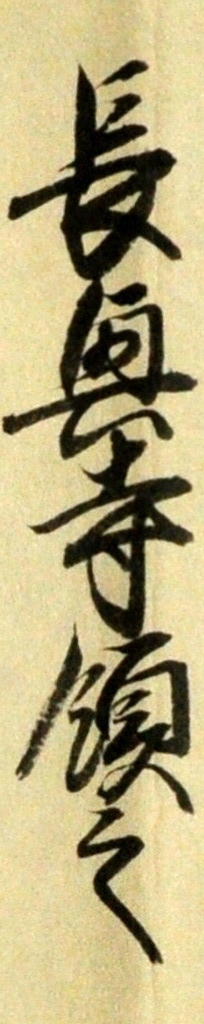長興寺領之
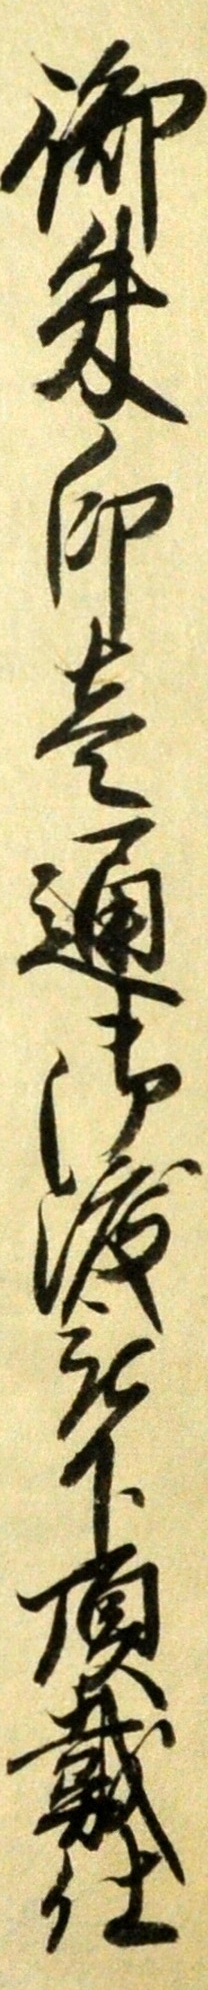御朱印壱通御渡被下頂戴仕
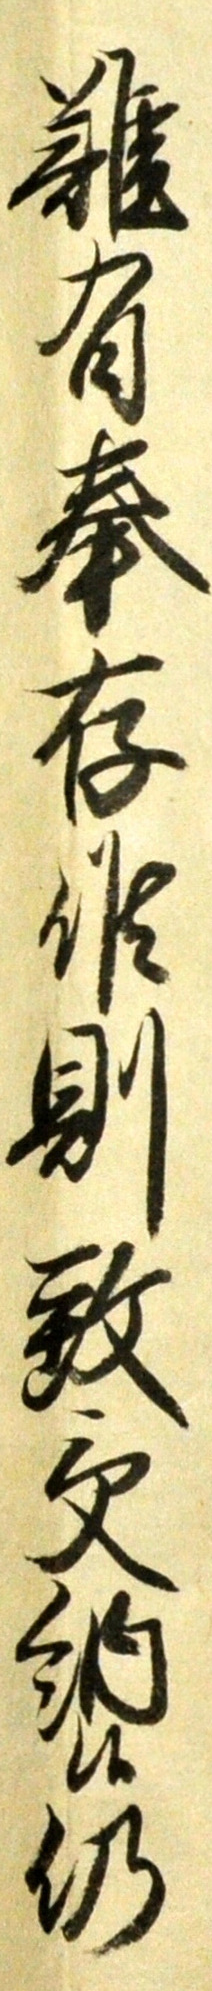難有奉存候則致受納候仍
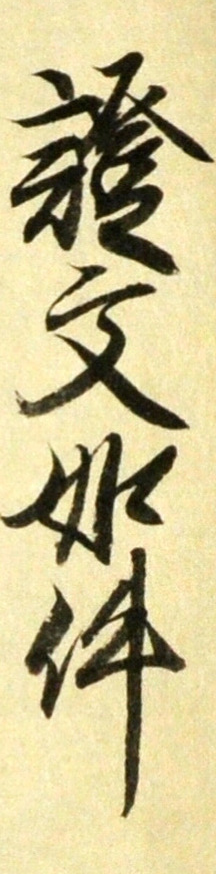証文如件
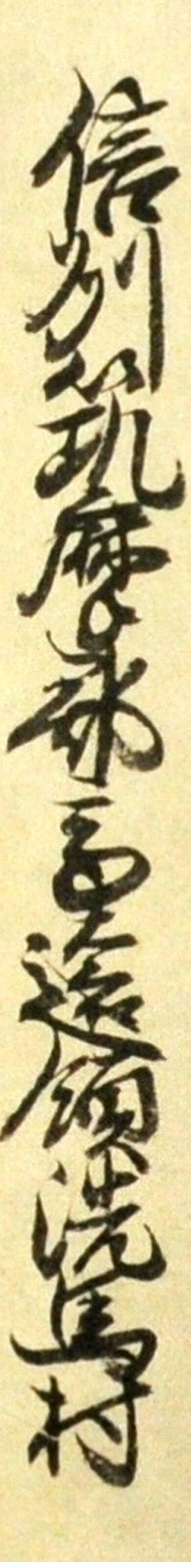信州筑摩郡高遠領洗馬村
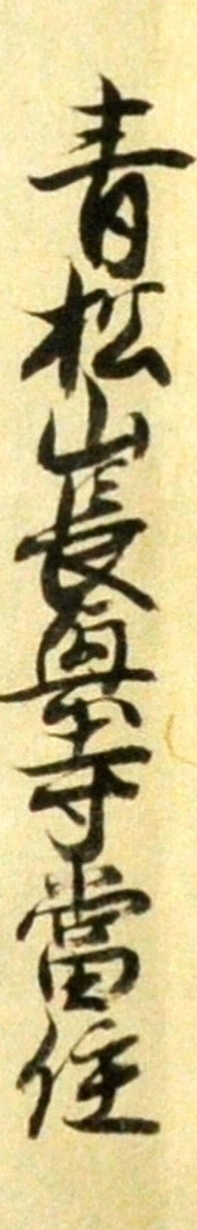青松山長興寺当住
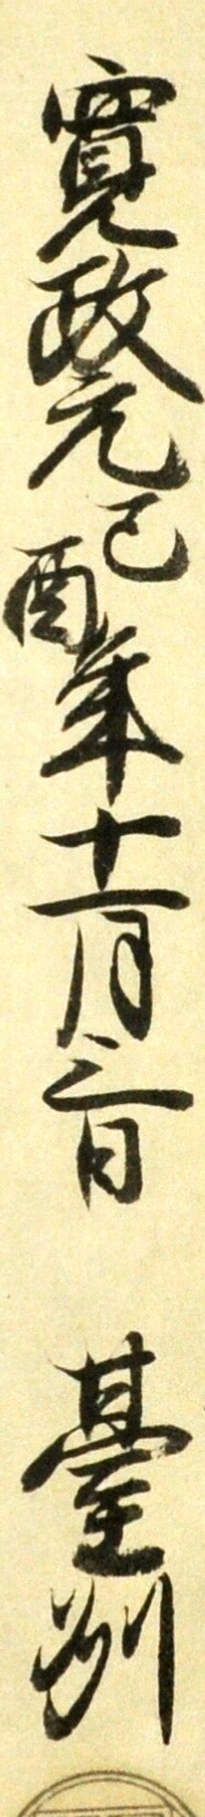寛政元巳酉年十一月三日台州
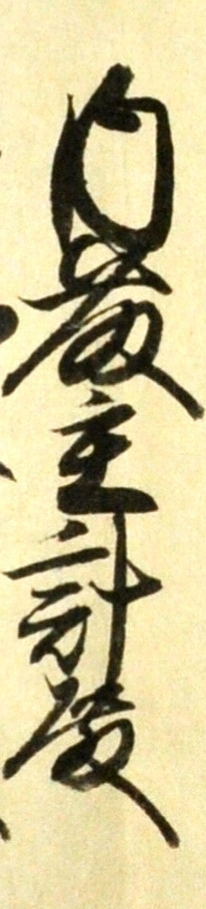内藤主計殿
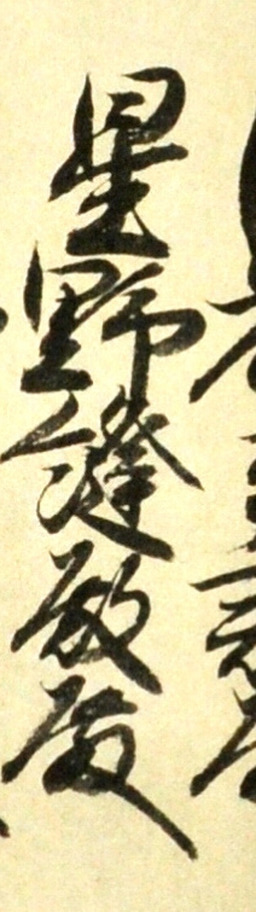星野縫殿殿
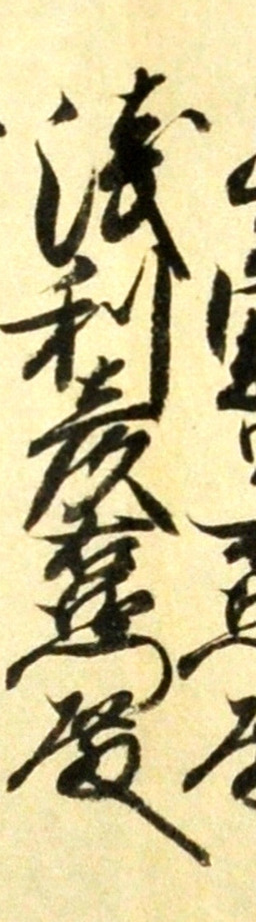浅利彦右衛門殿
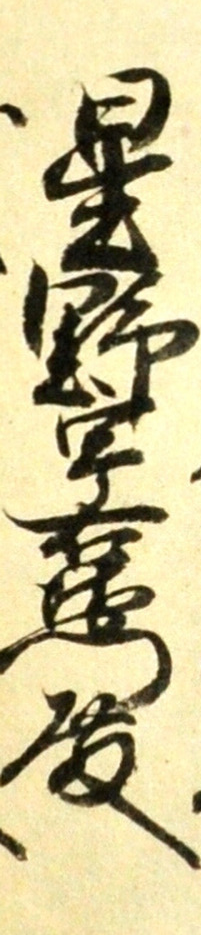星野宇右衛門殿
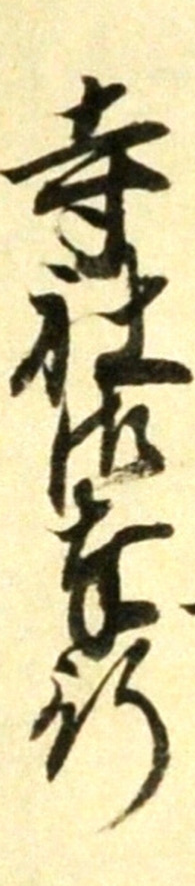寺社御奉行
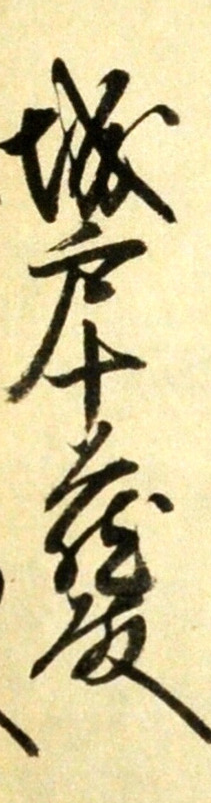城戸十蔵殿
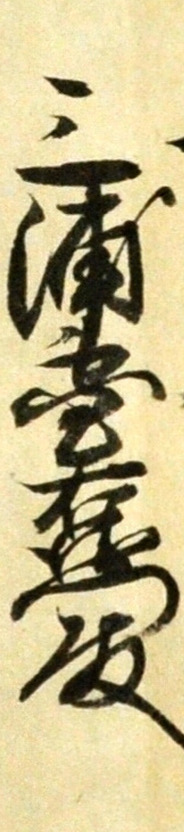三浦団右衛門殿
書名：証文
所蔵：伊那市立高遠町図書館・合同会社AMANE
